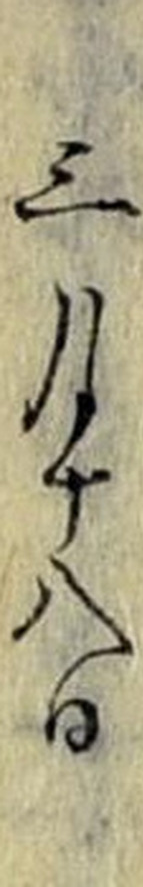三月十八日
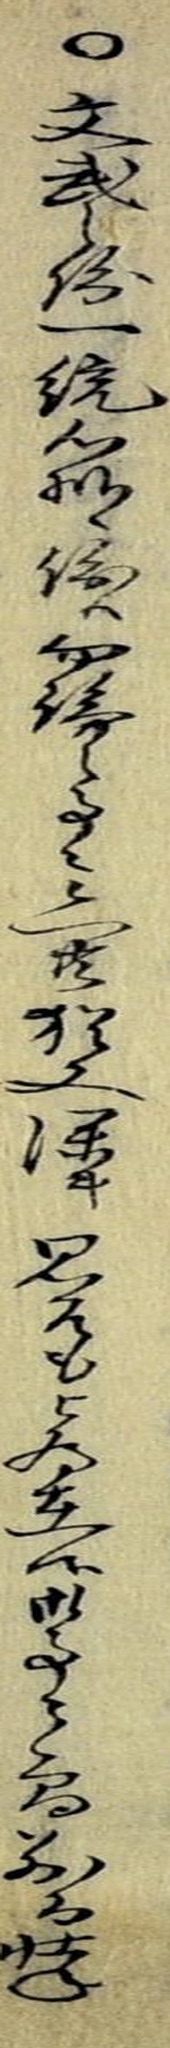○文武之儀一統心掛候儀は勿論之事に候へ共猶又深キ思召も被為在候御事に候間別而壮年
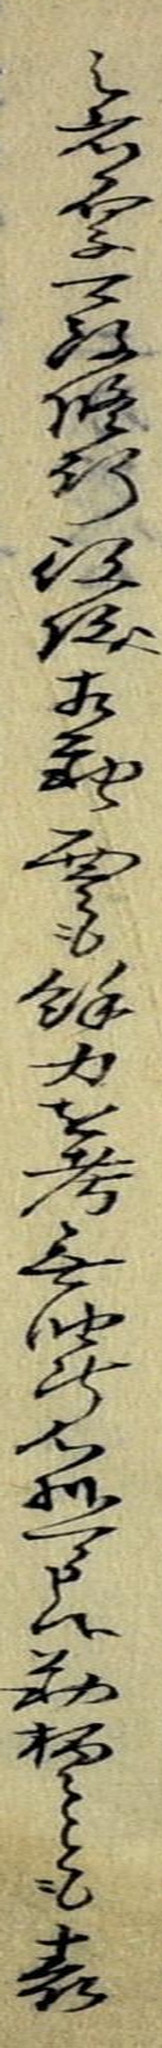之者厚可致修行役儀相勤候面々も餘力を考無由断心掛可申候勤柄に候とも表
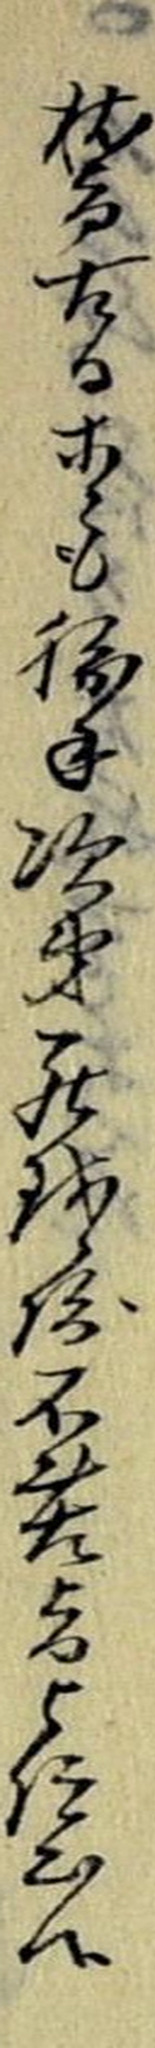稽古日等にも勝手次第罷越候儀不苦旨被仰出候
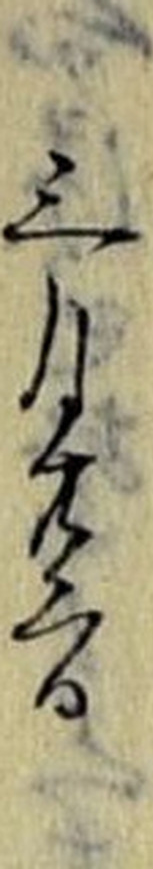三月廿二日
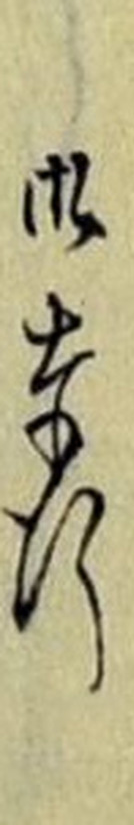御奉行
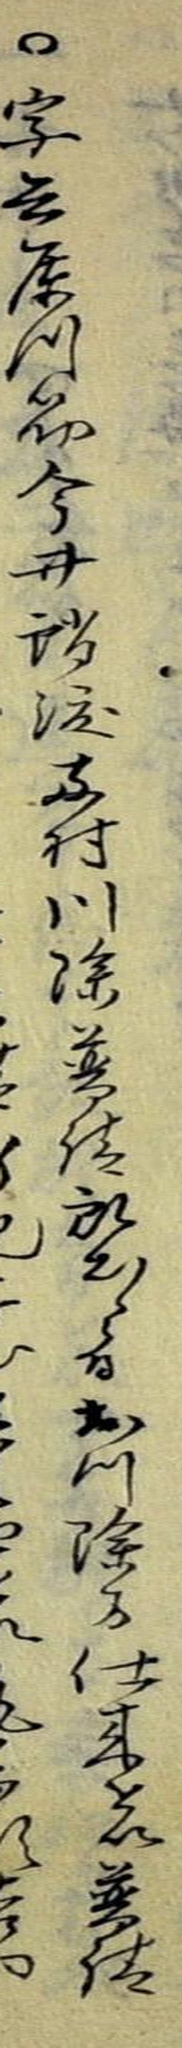○字兵庫川筋今井蛸渡両村川除普請願出候に付於川除方仕来を以普請
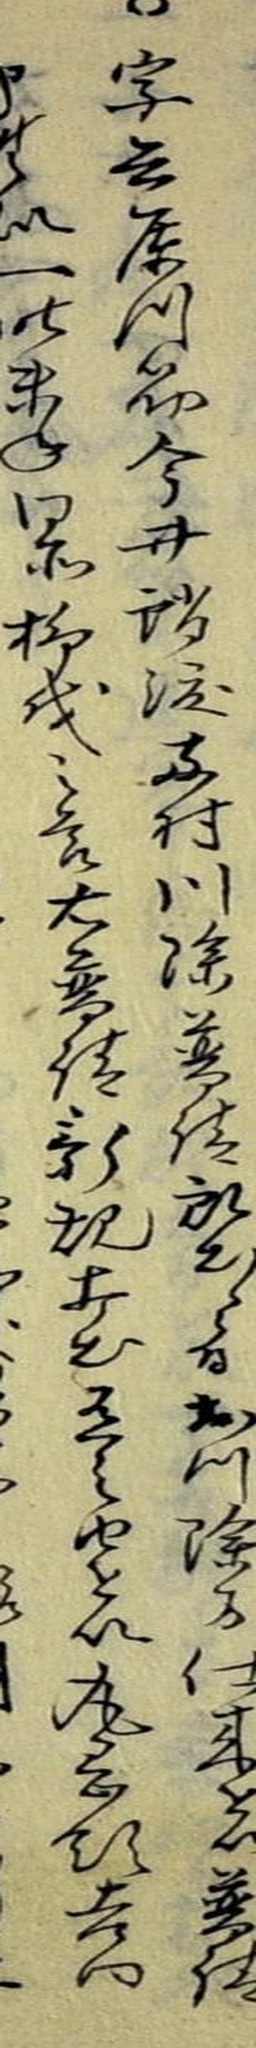申付候処一昨未年同所柳伐之節右普請新規打出有之由を以丸岡領吉田
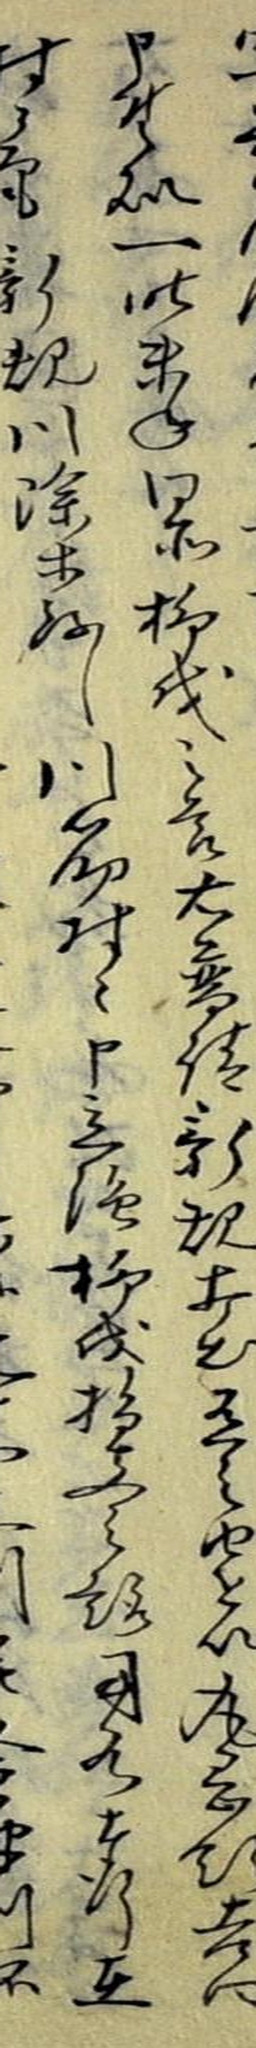村に而も新規川除等致し川筋村々申立強柳伐指支之趣用水奉行在
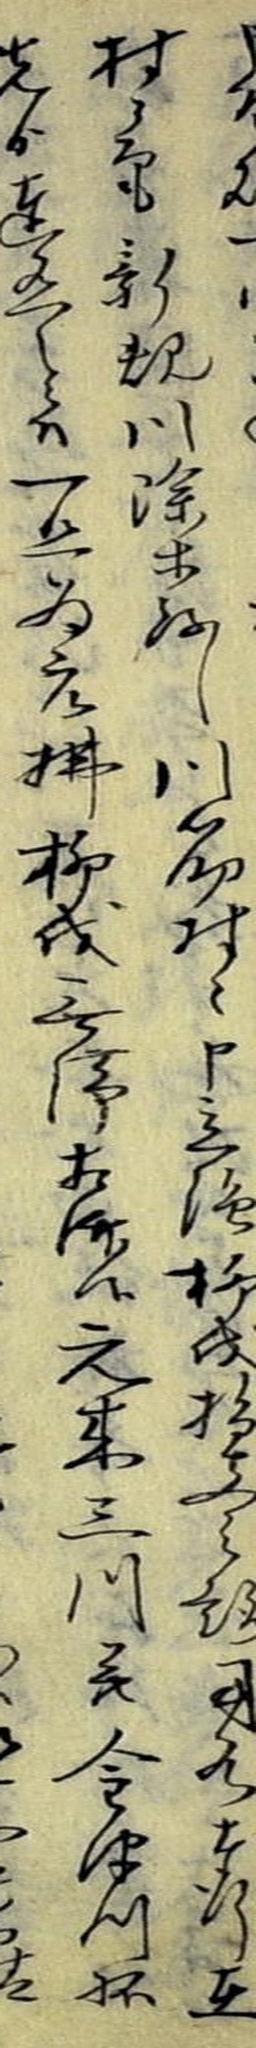先ゟ達有之候に付一旦為取払柳伐無滞相済候元来三川并金津川抔
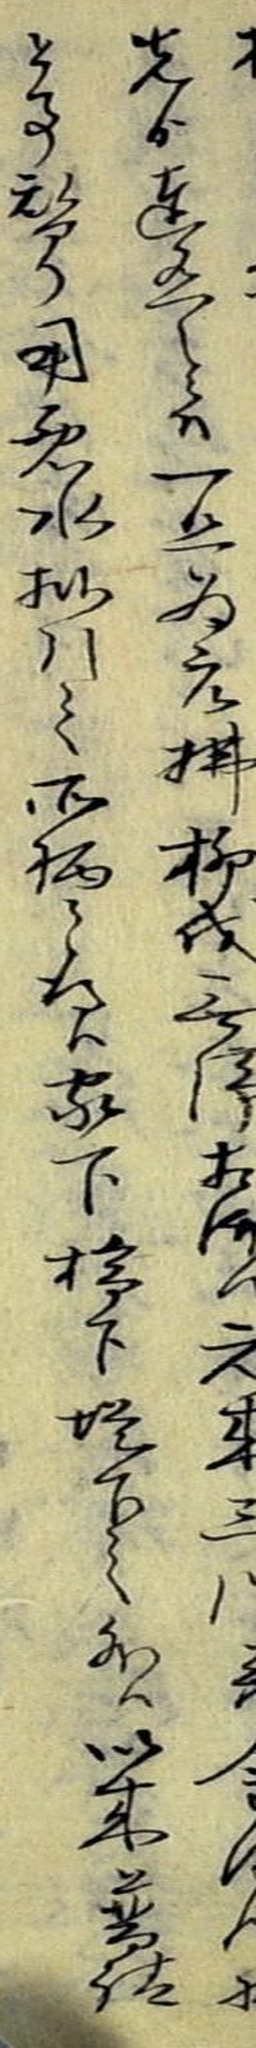と事替り用悪水掛引之所柄に候へは家下橋下堤下之外は以來普請
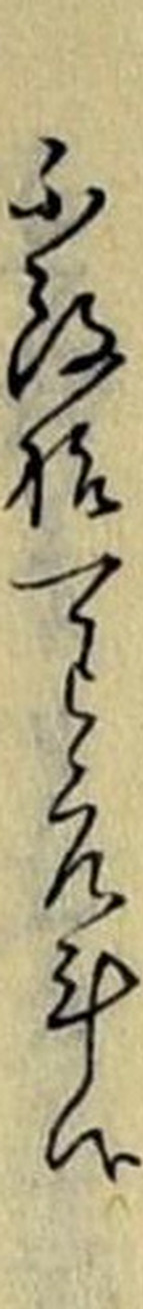不致様可被取斗候
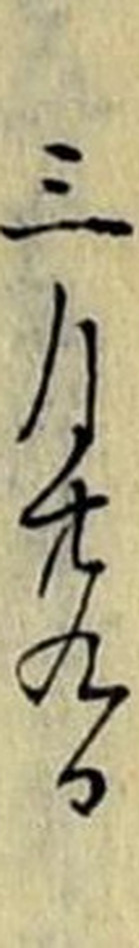三月廿九日
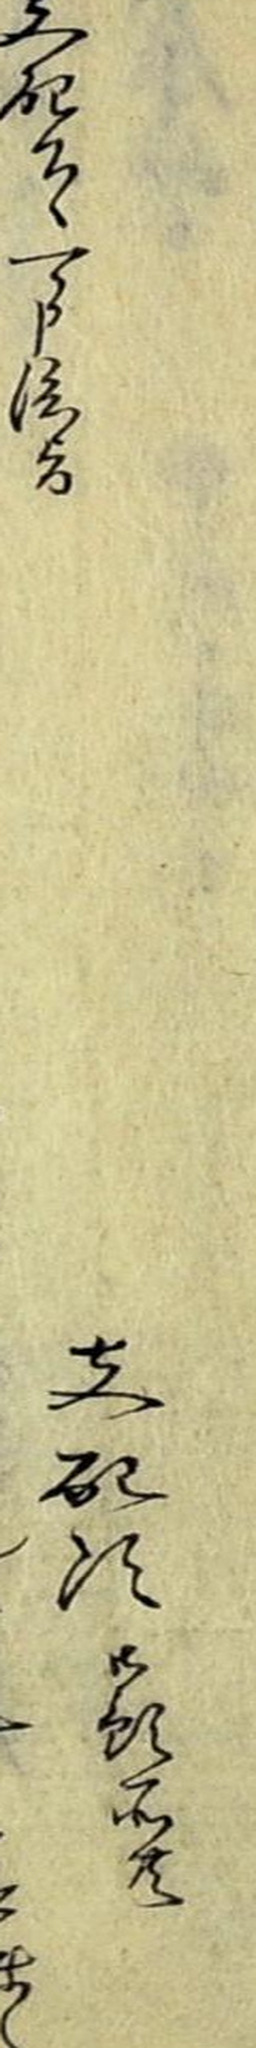支配下へ可申渡旨支配領御預所共
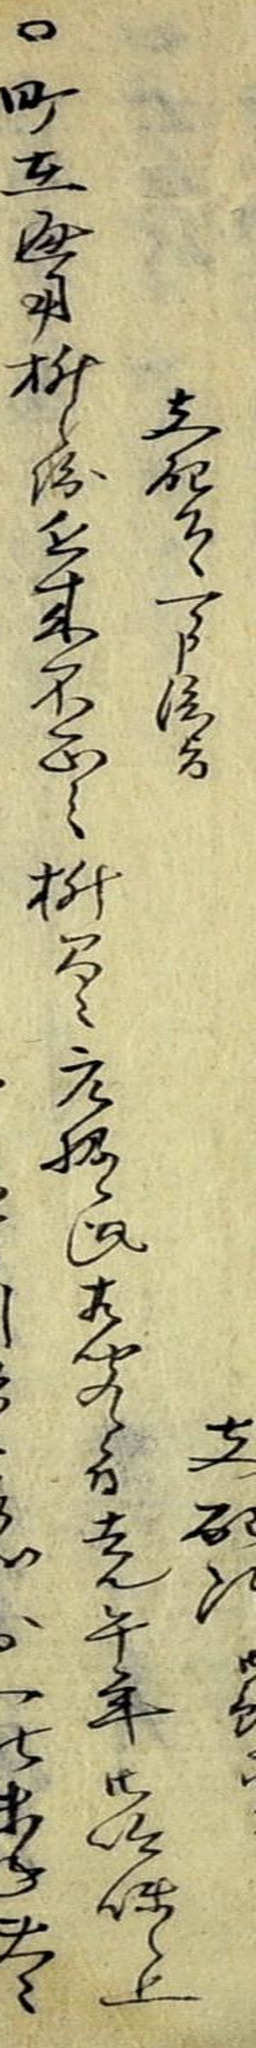○町在通用枡之儀近来不正之枡間々取扱候趣相聞候に付去ル午年御吟味之上
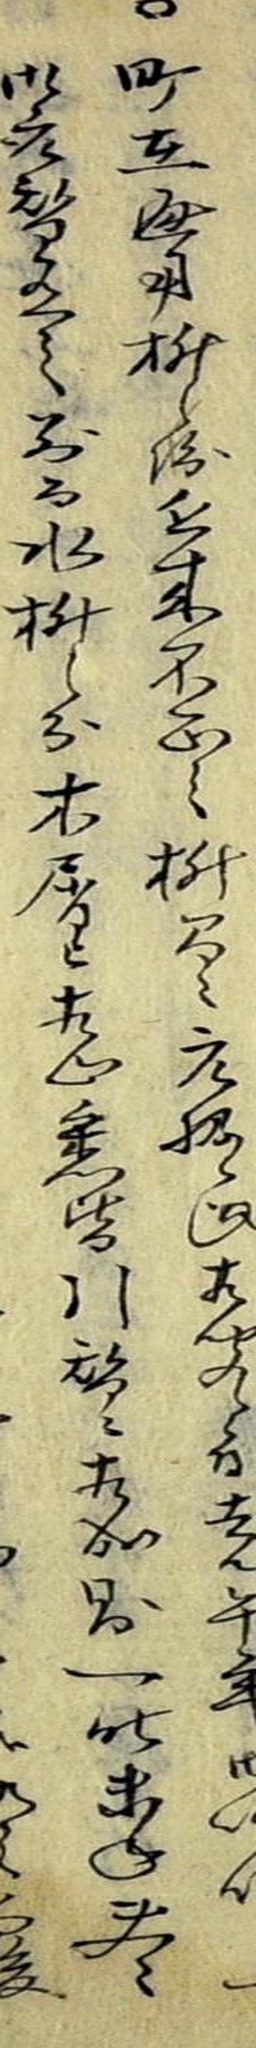御取替有之別而水枡之分木屑被相止悉皆引替に相成則一昨未年夫々
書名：命令之部 六
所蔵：福井県文書館 Fukui Prefectural Archives
